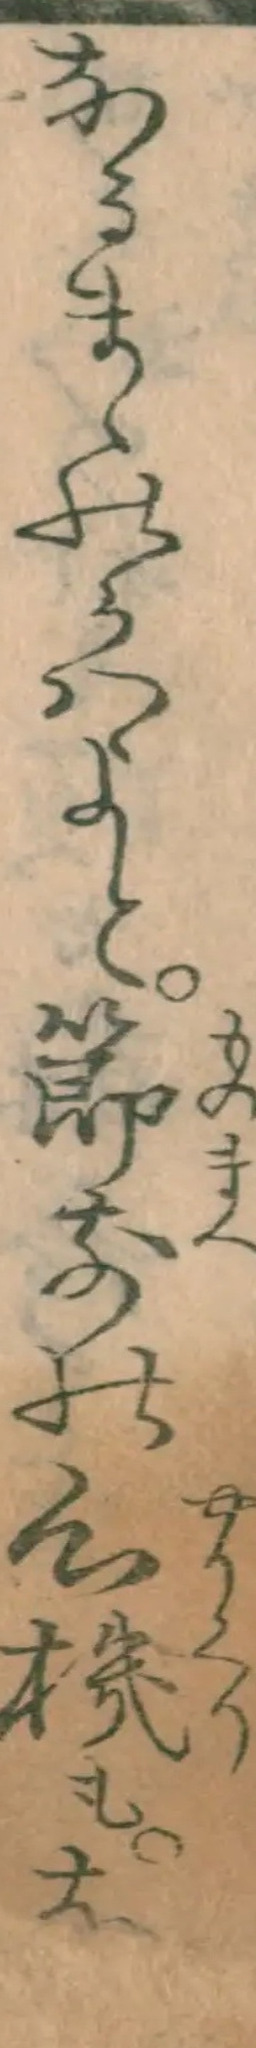なるまゝのかはよと。節前の心機も。なく
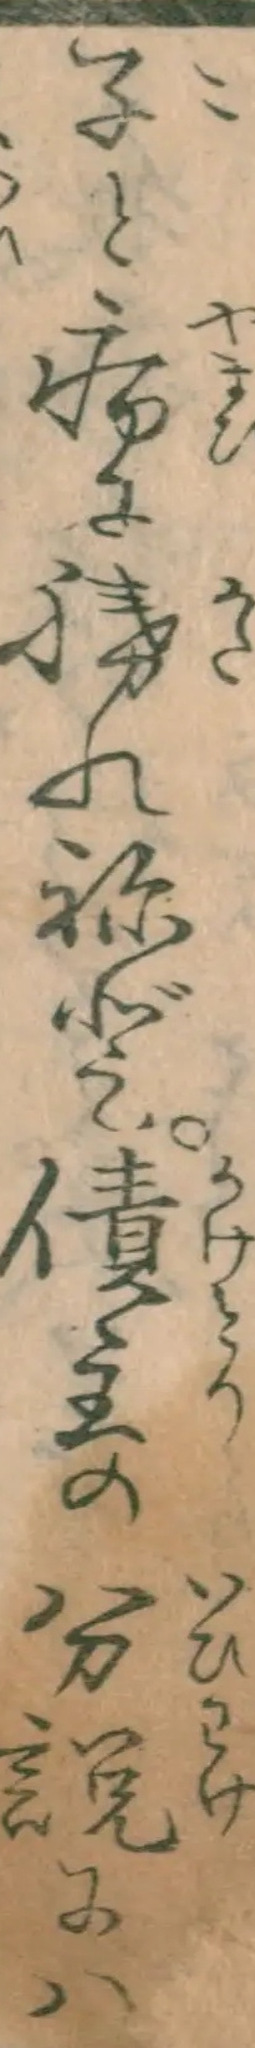子と病に勝れねど。債主の分説には。
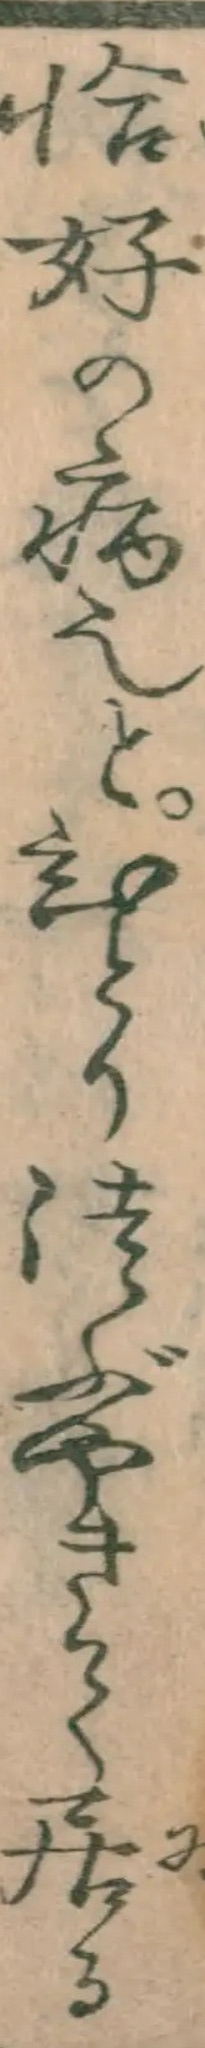恰好の病也と。ひとりつぶやきて居る
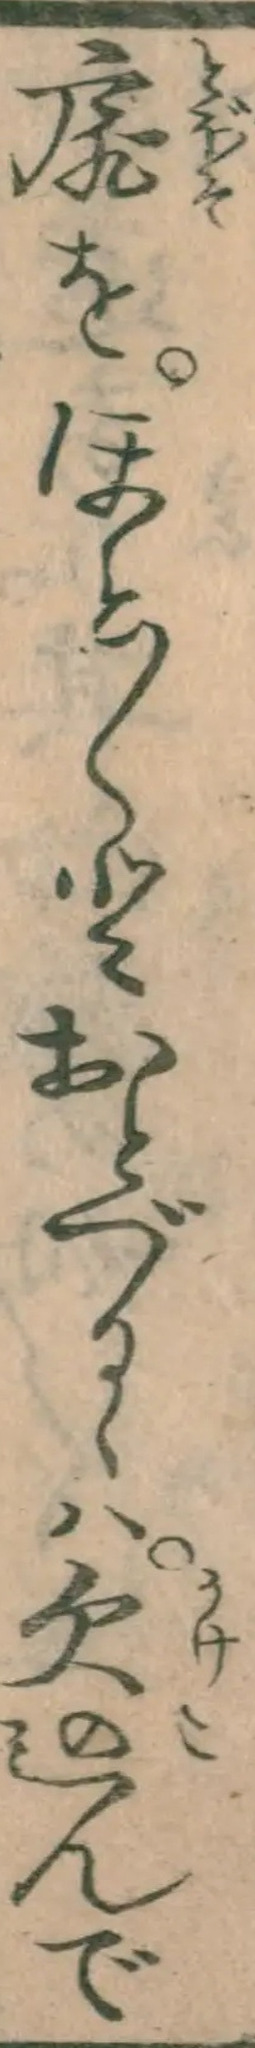扉を。ほと〳〵とおとづるゝは。欠込んで
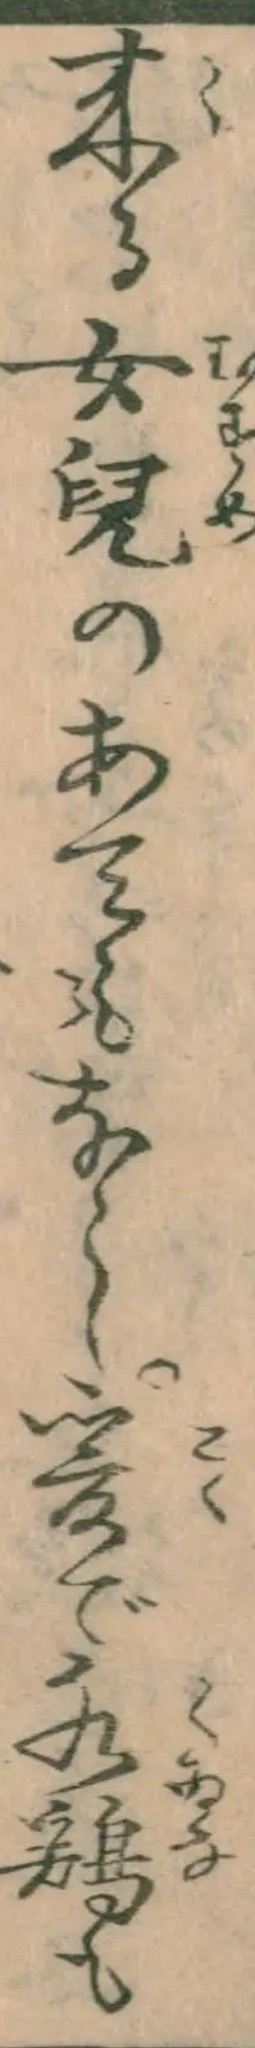来る女児のあてもなし。爰で水鶏も
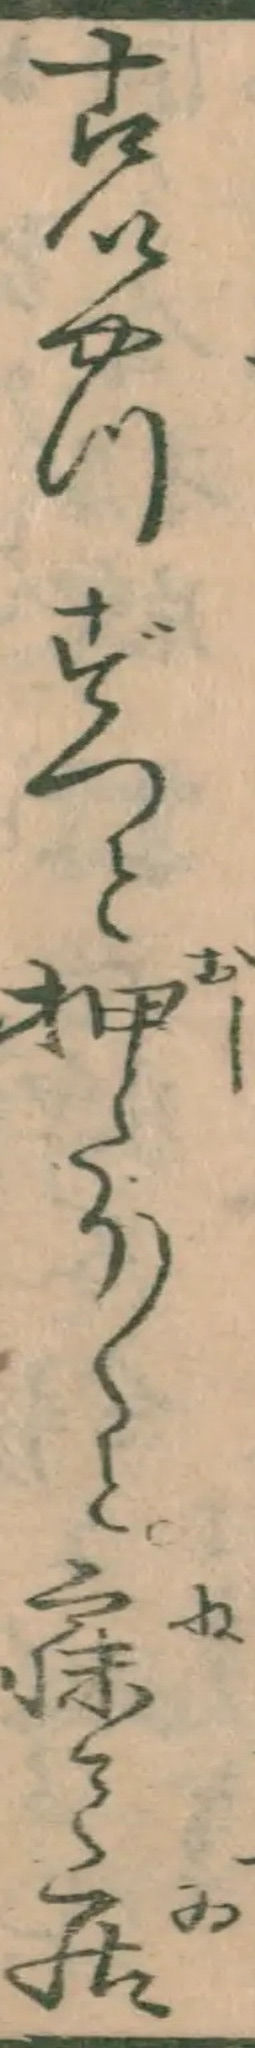古いやつずつと押たり〳〵と。寢て居
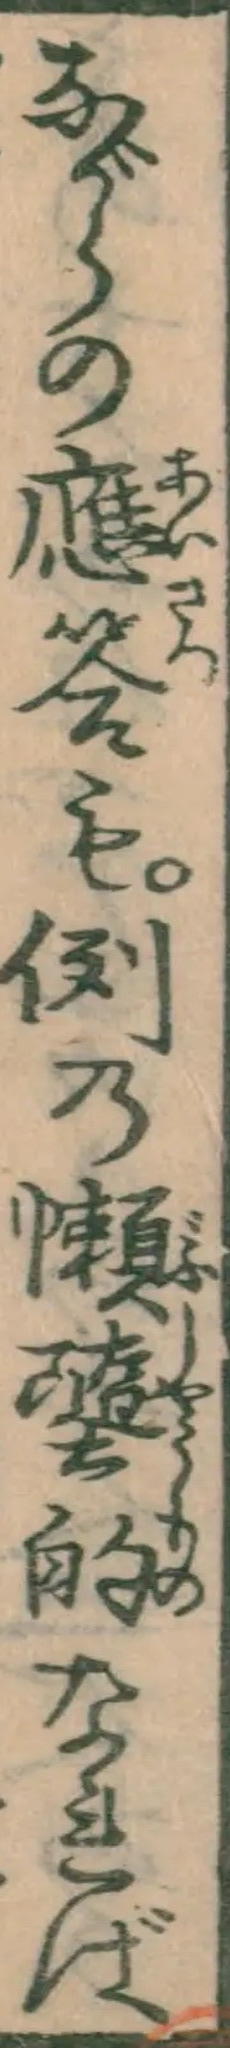ながらの応答も。例の懶堕的なれば
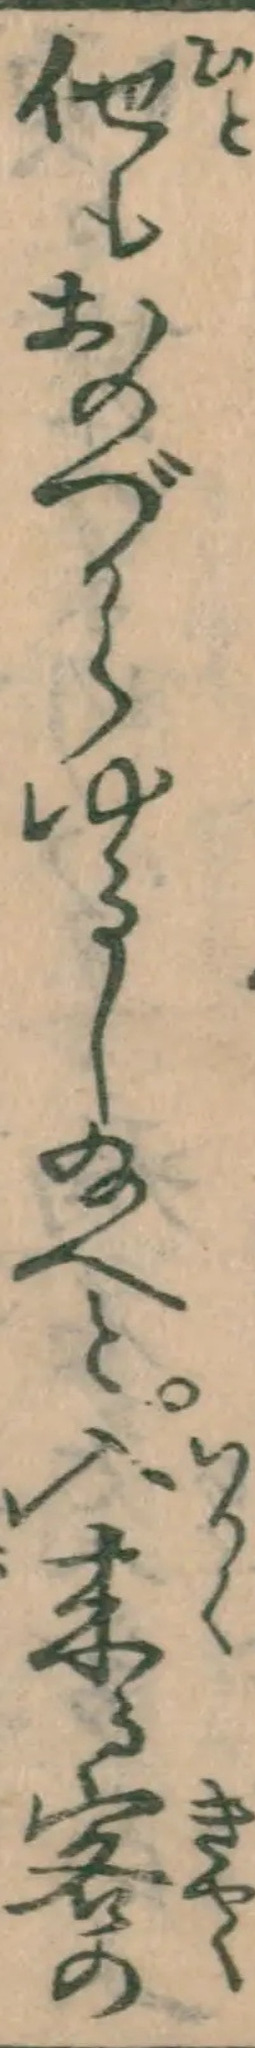他もおのづからゆるし給へと。入来る客の
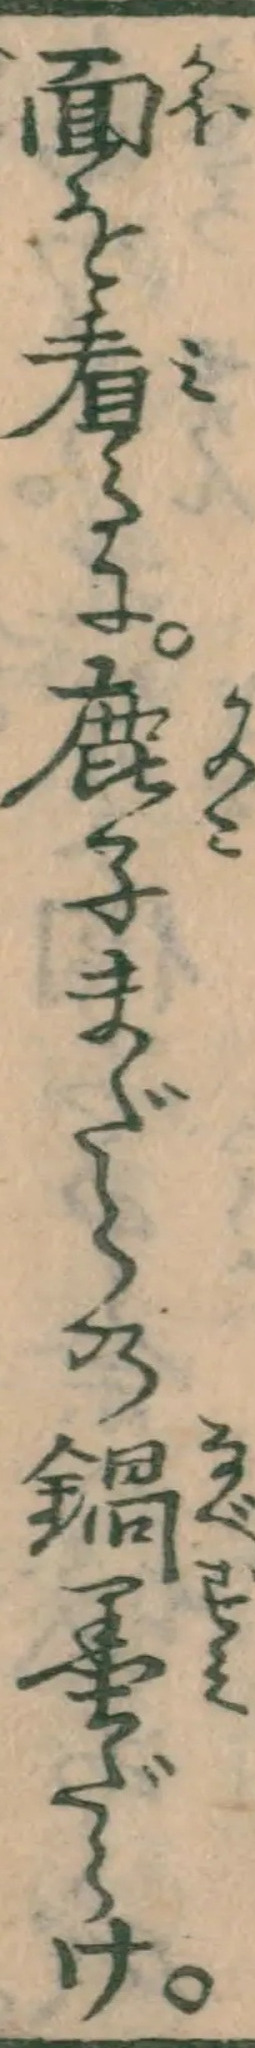面を看るに。鹿子まだらの鍋墨だらけ。
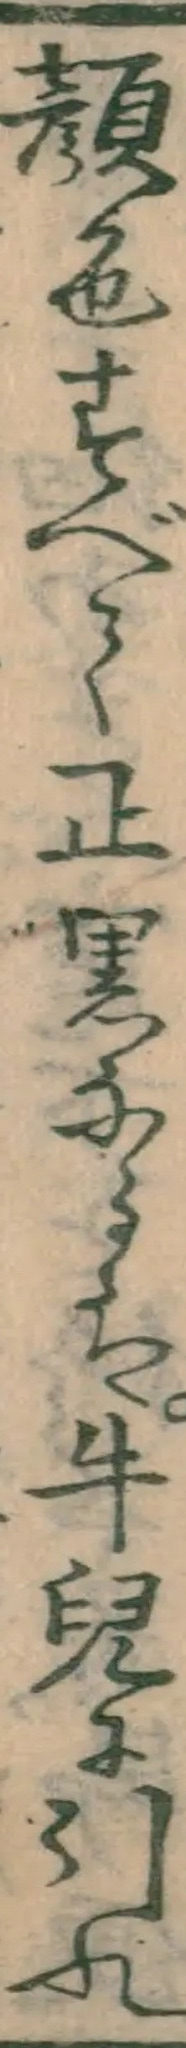顔色すべて正黒なるは。牛児に引れ
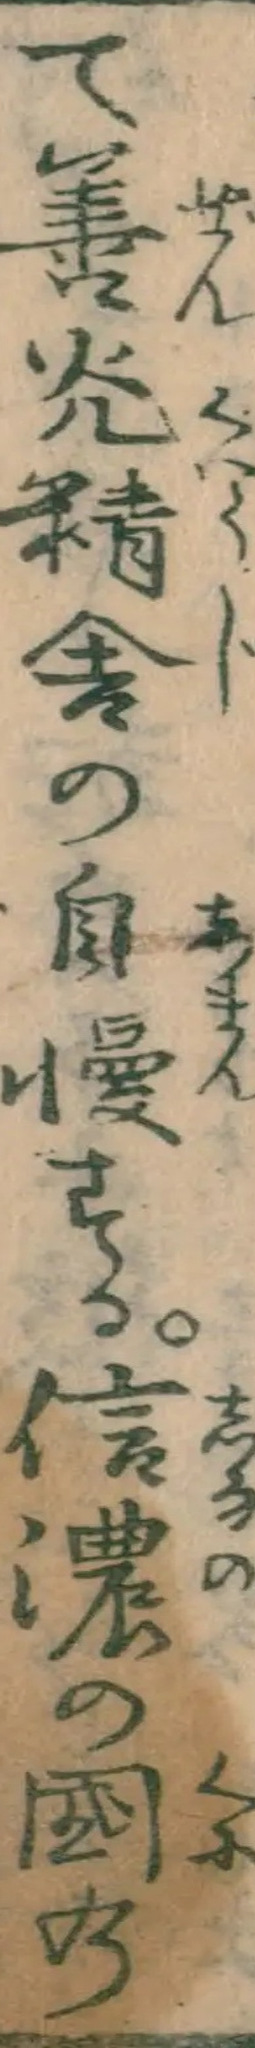て善灮精舎の自慢する。信濃の国の
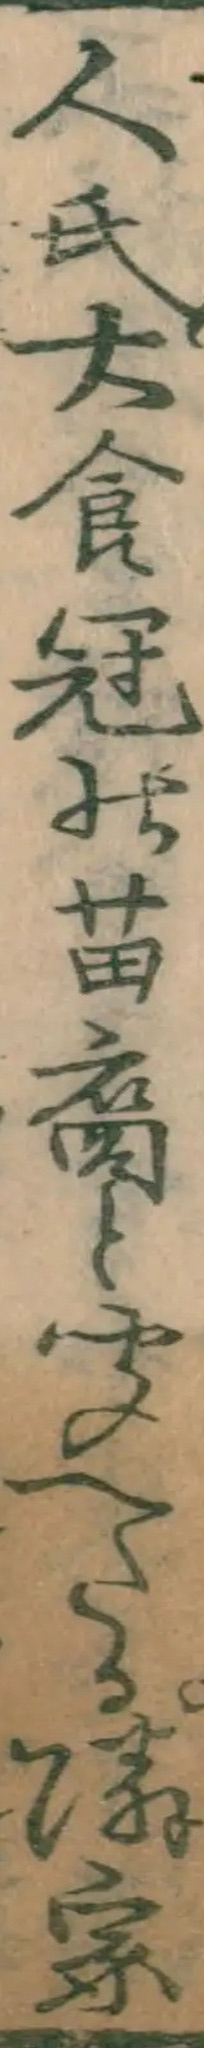人民。大食冠の苗裔と聞へたる。隣家
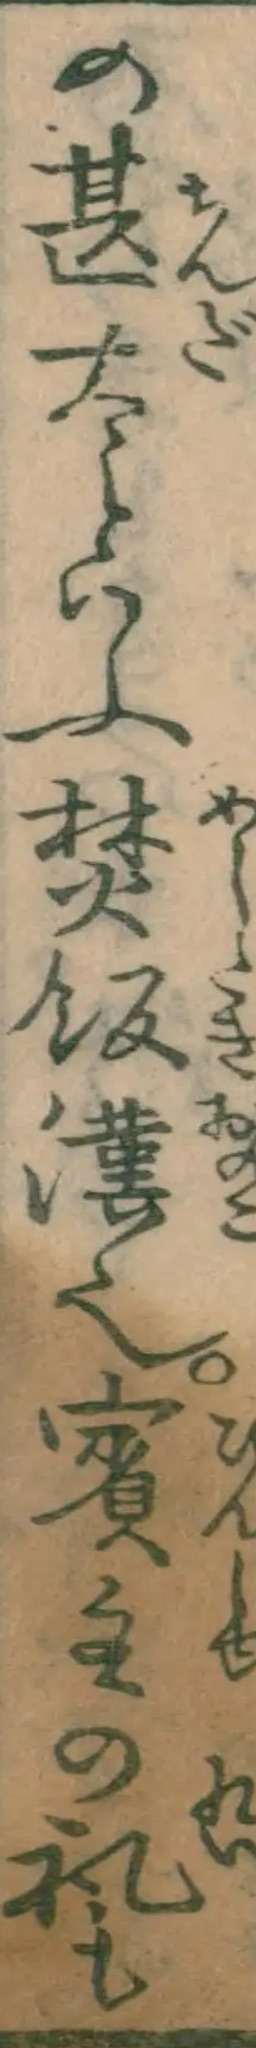の甚太といふ焚飯漢也。賓主の礼も

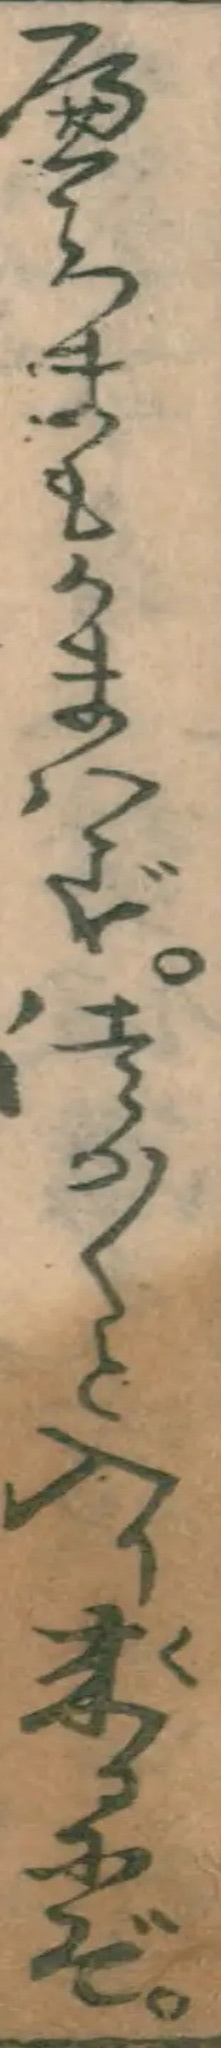へちまもかまはず。つか〳〵と入り来るにぞ。
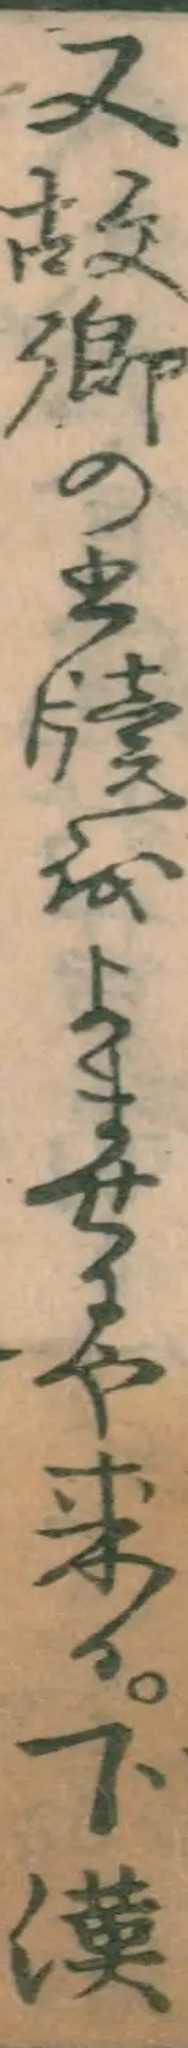又故郷の書牘をよませにや来る。下漢
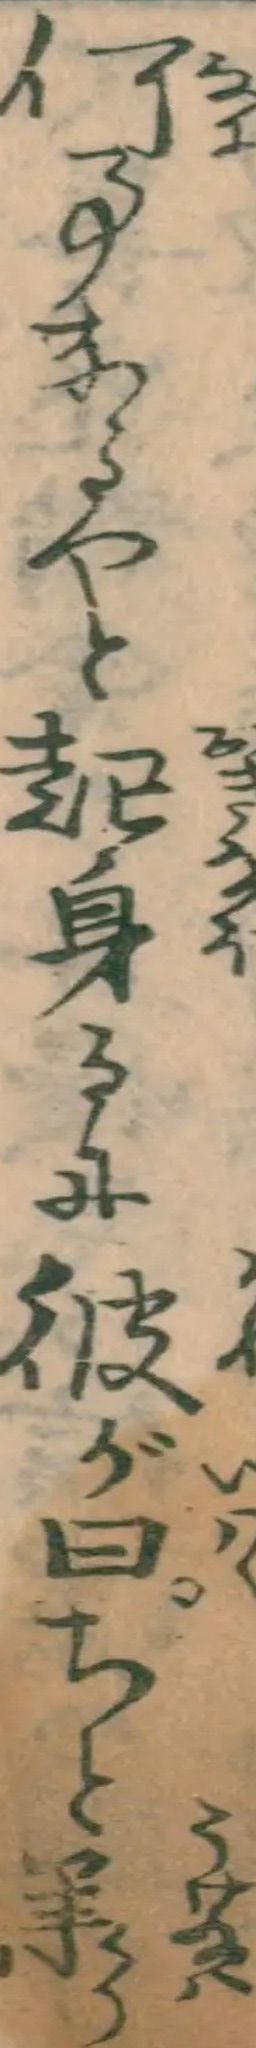何事なるやと起身るに彼が曰。ちと承り
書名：麻疹戯言
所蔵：国立国会図書館 National Diet Library, JAPAN
